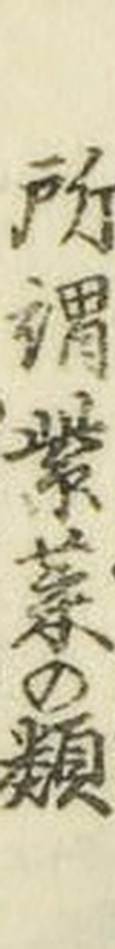所謂紫菜の類
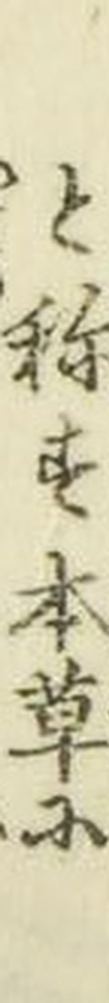と称す本草に
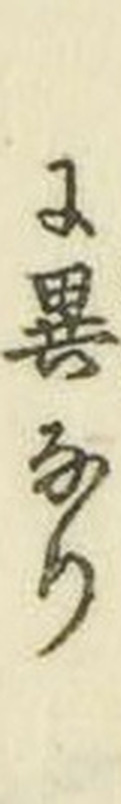に異なり
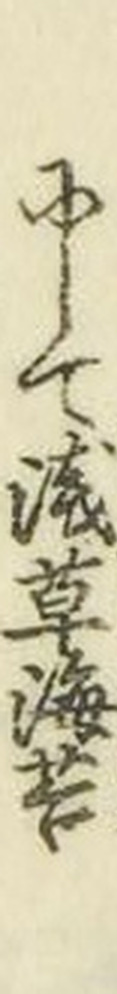にして浅草海苔
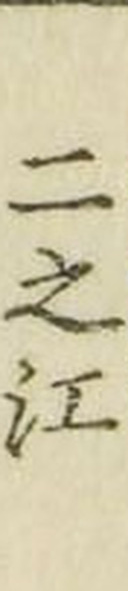二之江
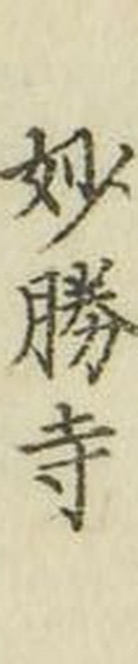妙勝寺

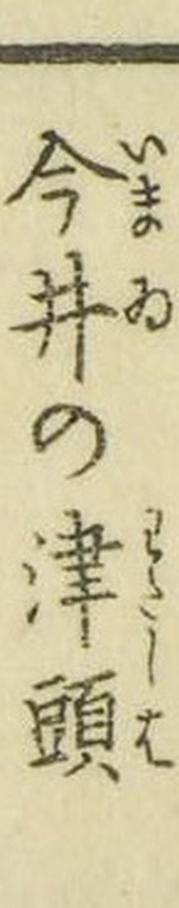今井の津頭
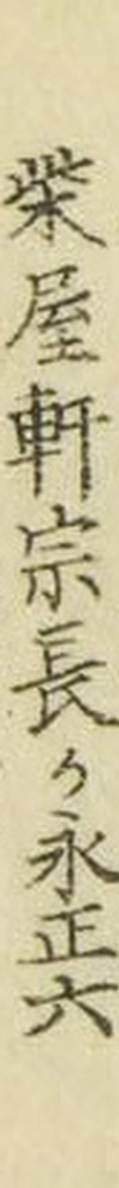柴屋軒宗長か永正六
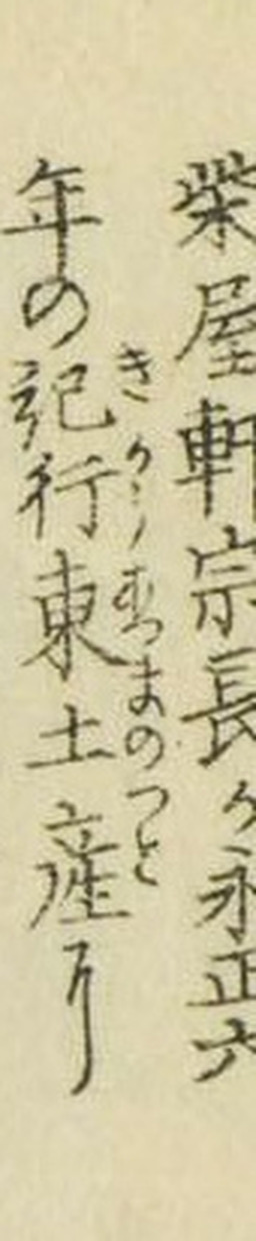年の紀行東土産に
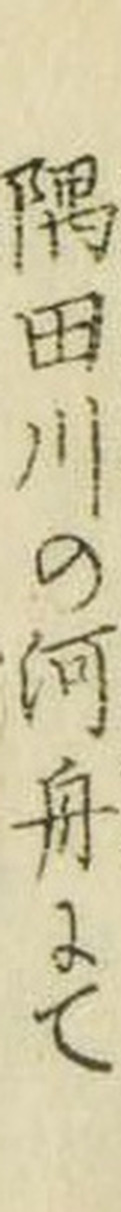隅田川の河舟にて
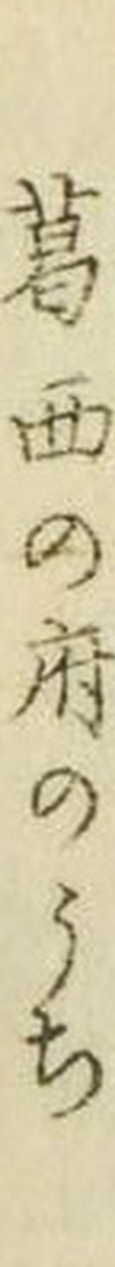葛西の府のうち
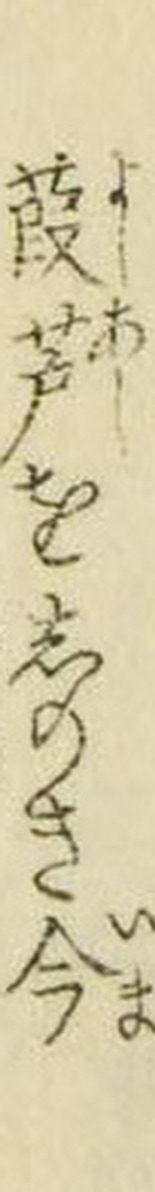葭芦をしのき今
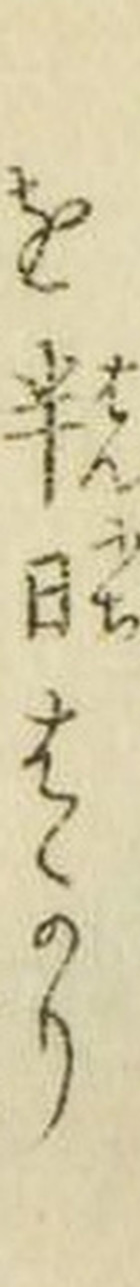を半日はかり
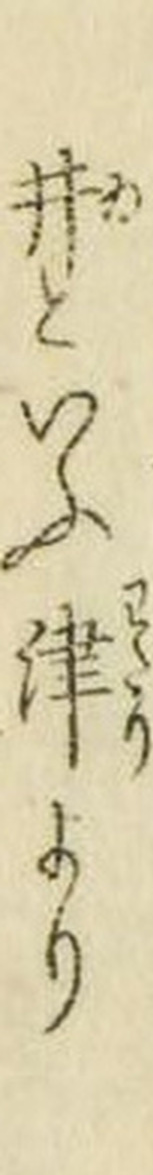井といふ津より
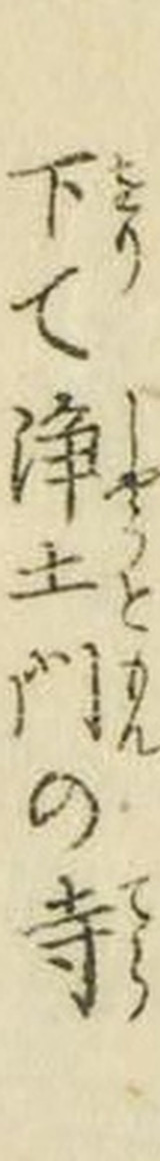下て浄土門の寺
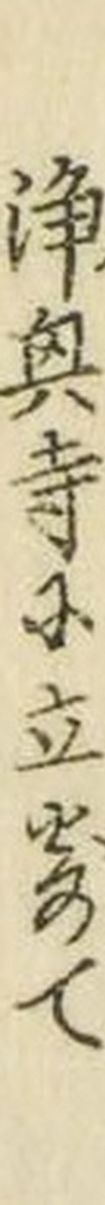浄興寺に立寄て
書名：江戸名所図会 20巻 巻之19
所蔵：東京学芸大学教育コンテンツアーカイブ
